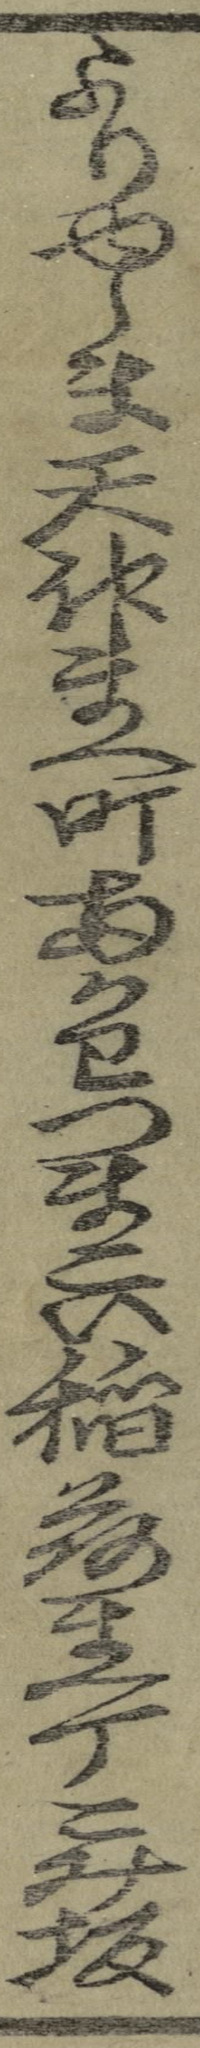よりゆしま天神まへ町両かわつまこい稲荷まへ丁こみ坂
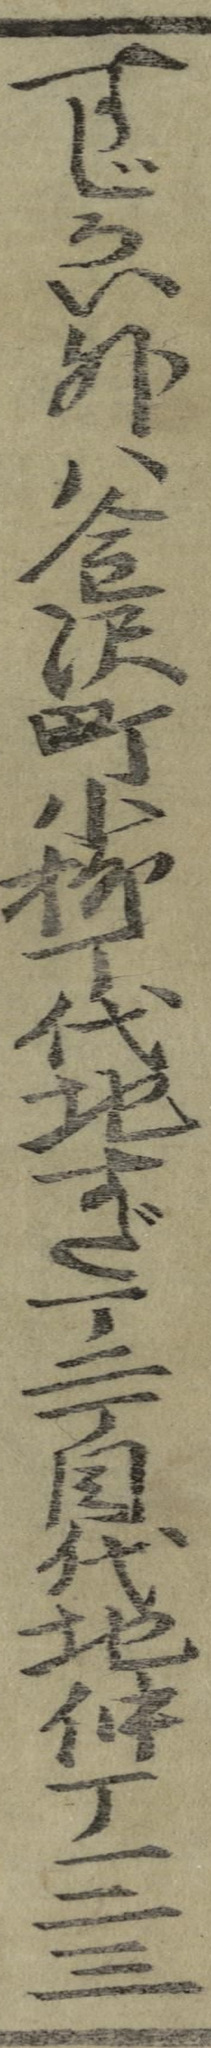すじかい外は金沢町小柳丁代地すだ丁二丁目代地仲丁一二三
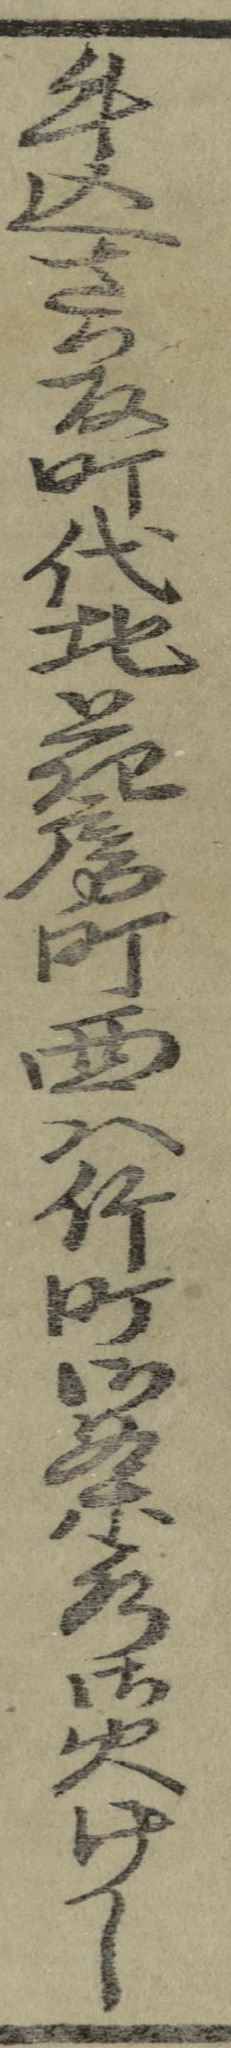牛込さかな町代地花房町西は竹町御茶水御火けし
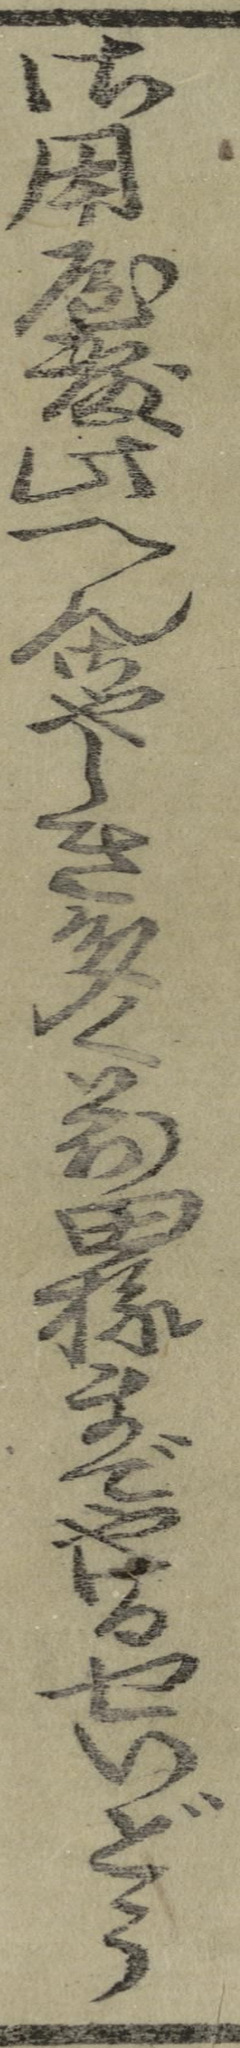御用家敷此へん御やしき多く前田様までやけるせいどう
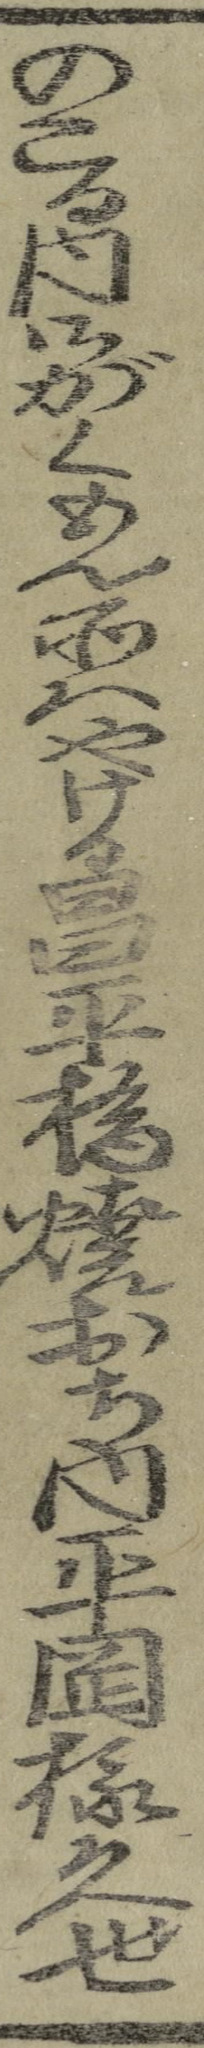のこる内御がくもん所はやける昌平橋焼おち内平岡様久世
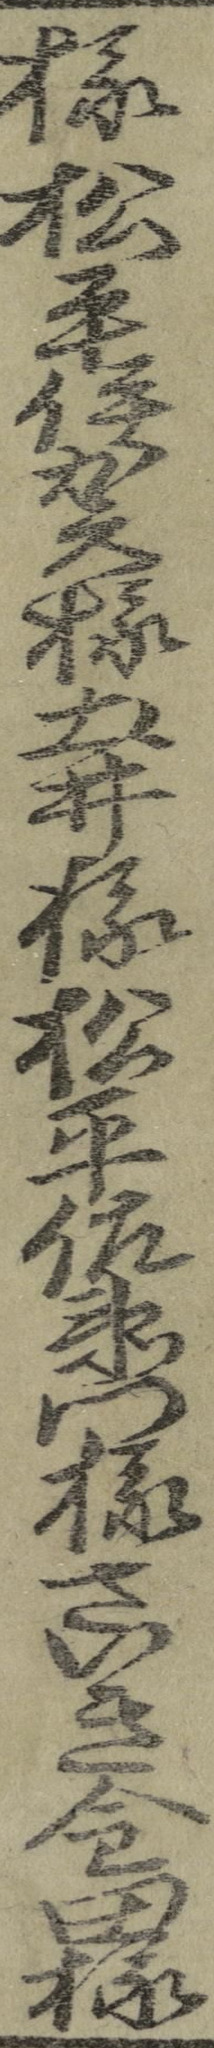様松平伊賀様土井様松平左衛門様さいき金田様
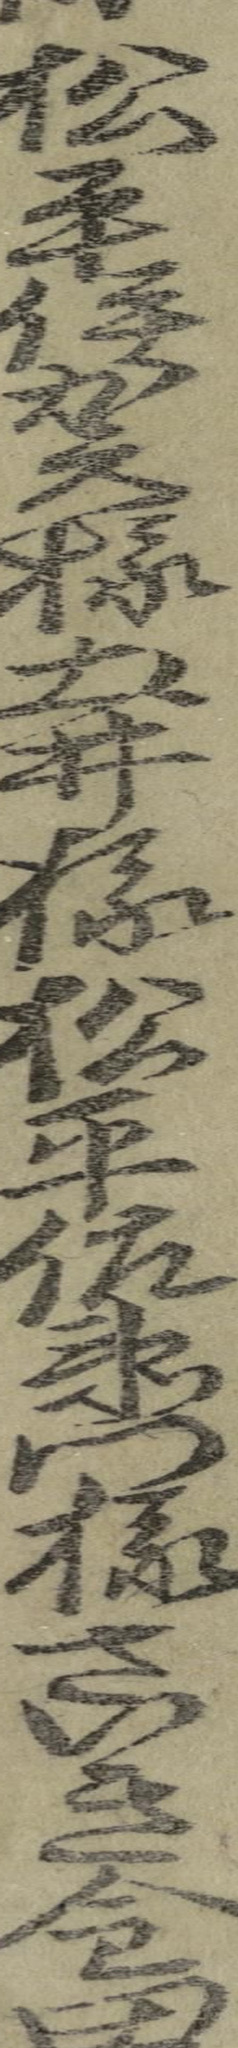様松平伊賀様土井様松平左衛門様さいき金田様
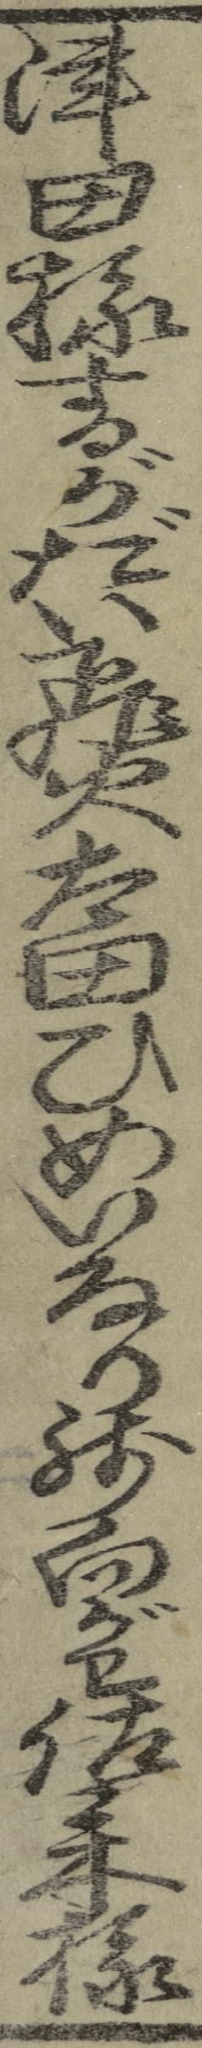津田様するがだい飛火太田ひめいなり残向がわ佐々木様
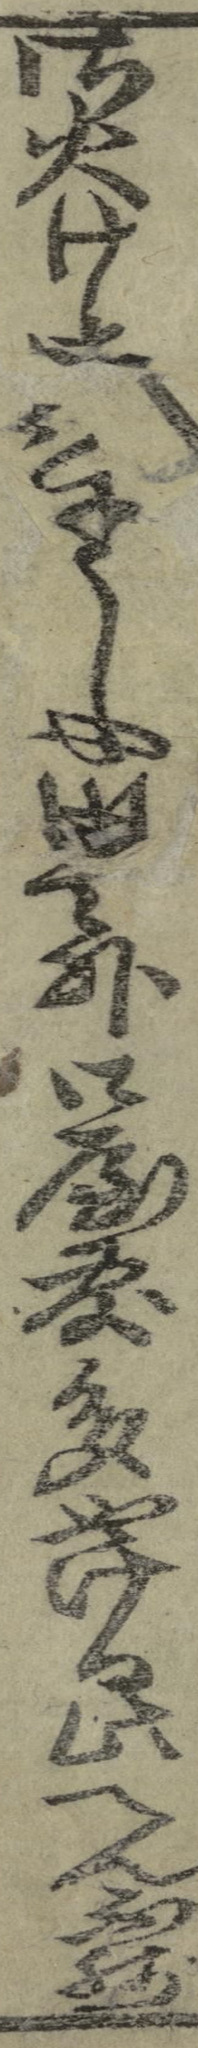御火けし由其外御屋敷多やける此へん不残
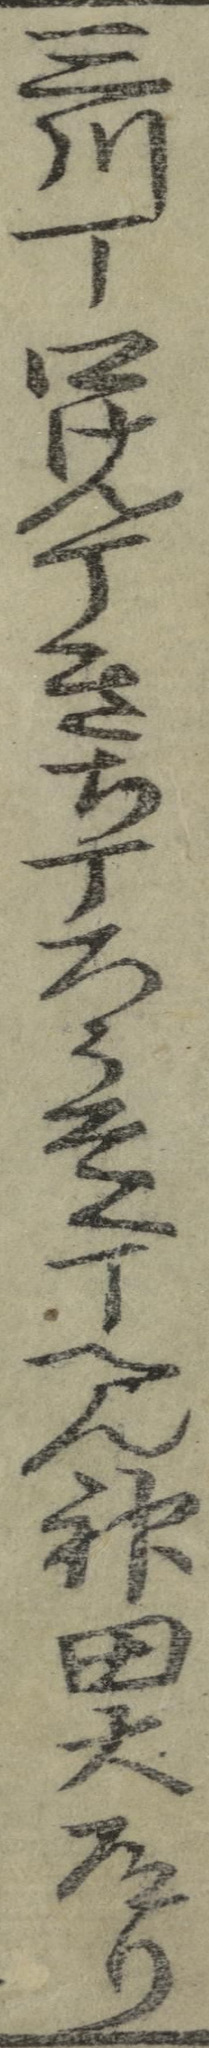三川丁口けん丁きち丁ろうそく丁へん神田大道り
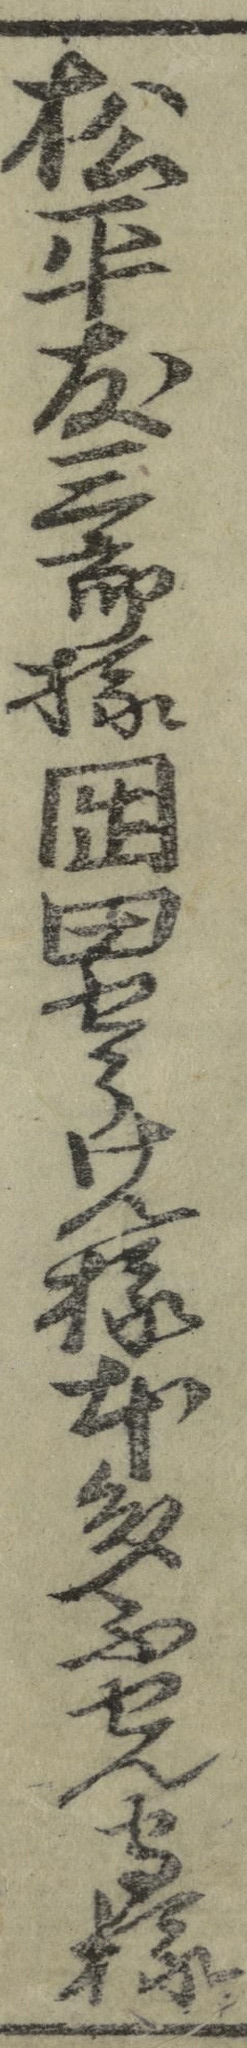松平友三郎様岡田せうけん様本多ふせん守様
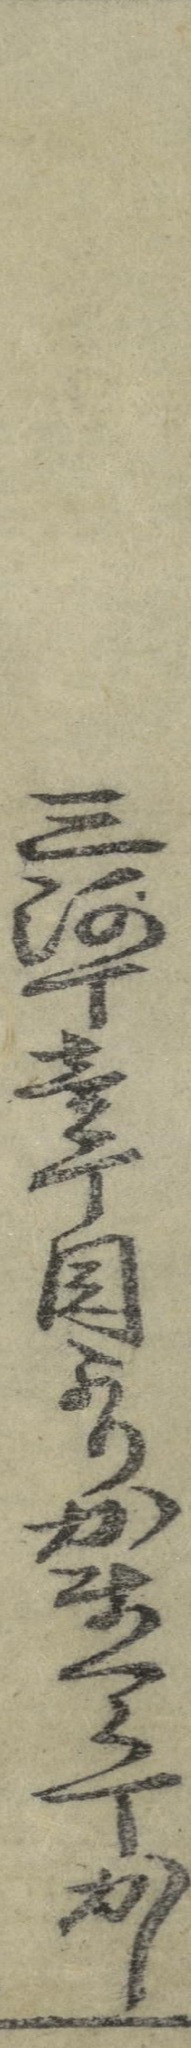三河丁壱丁目よりかまくら丁かし
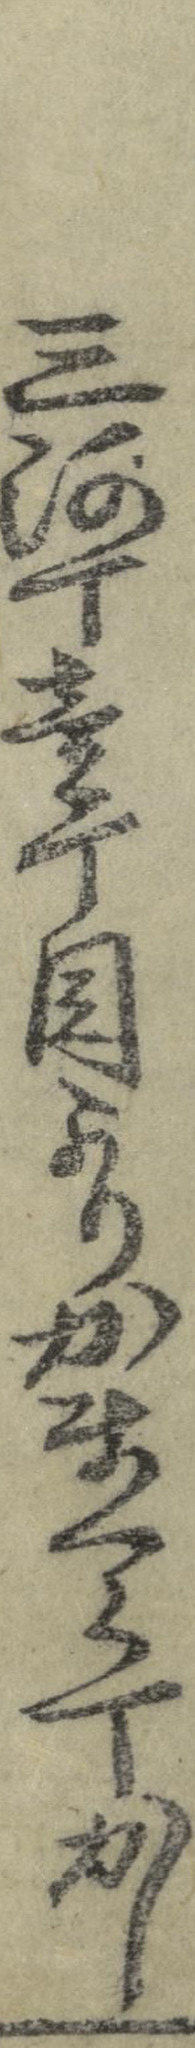三河丁壱丁目よりかまくら丁かし
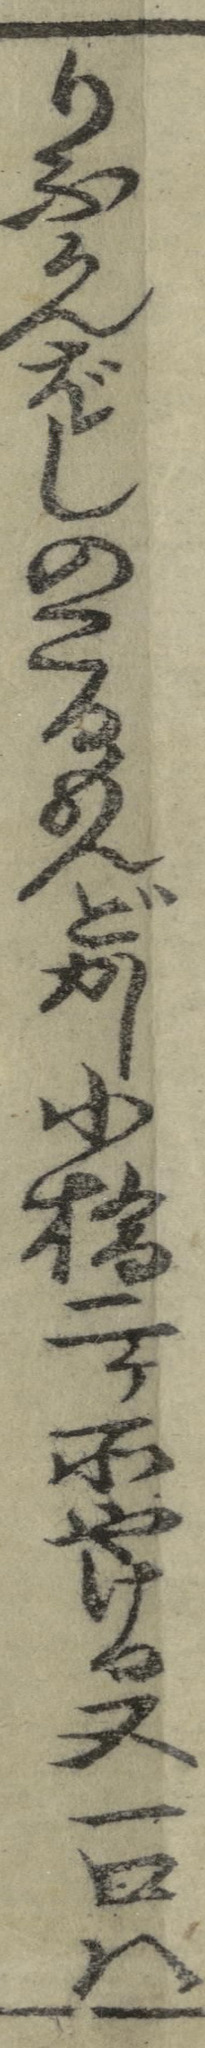りふかんばしのこるもんどかし小橋ニケ所やける又一口は
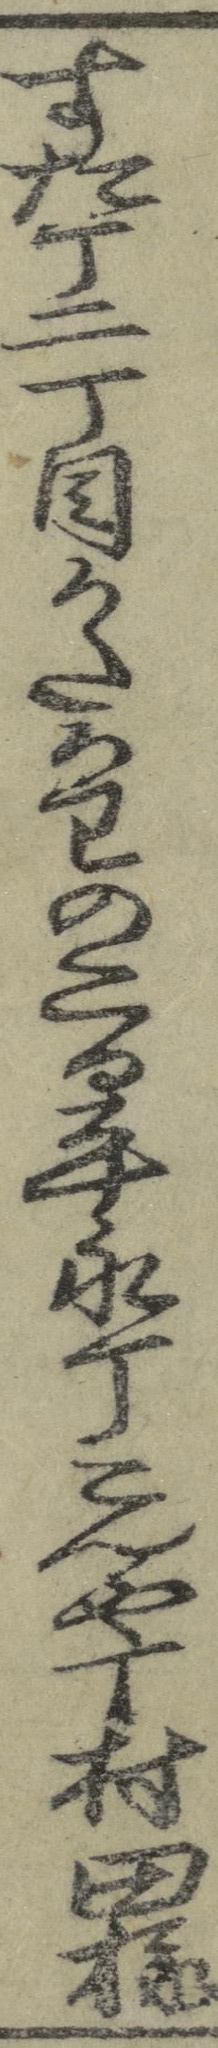すた丁二丁目かたかわのこる平永丁こんや丁村田様
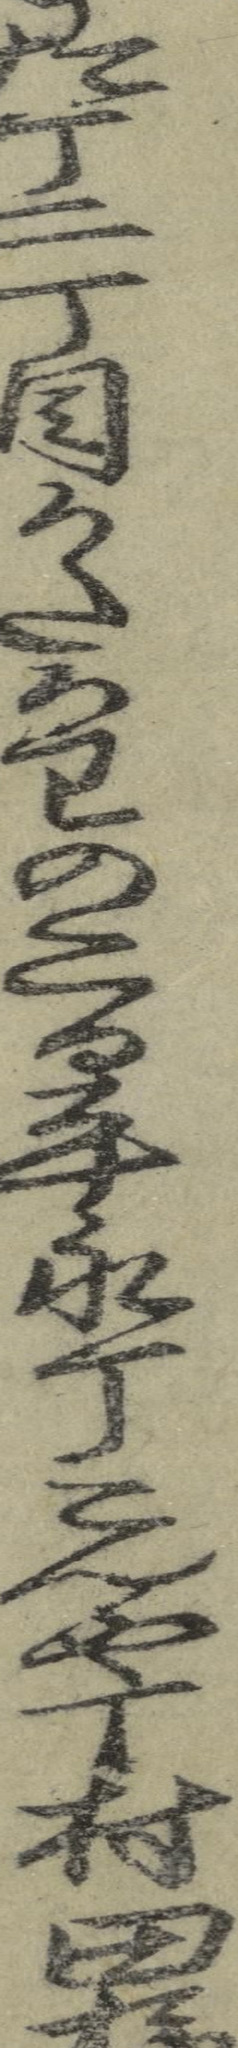すた丁二丁目かたかわのこる平永丁こんや丁村田様
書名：[弘化三年一月の江戸大火に関する瓦版]
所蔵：東京大学地震研究所図書室 Earthquake Research Institute Library, The University of Tokyo, JAPAN
